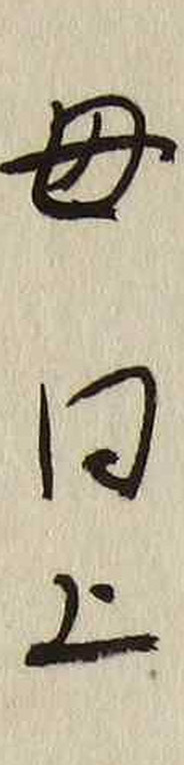母同上

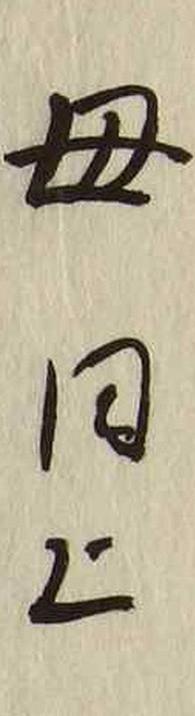母同上
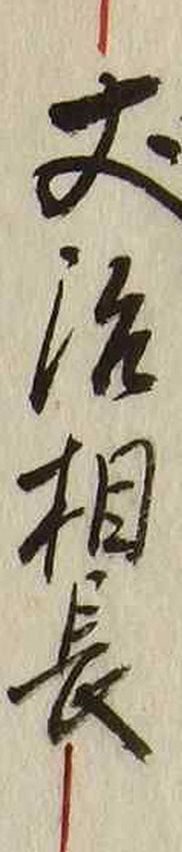丈治相長
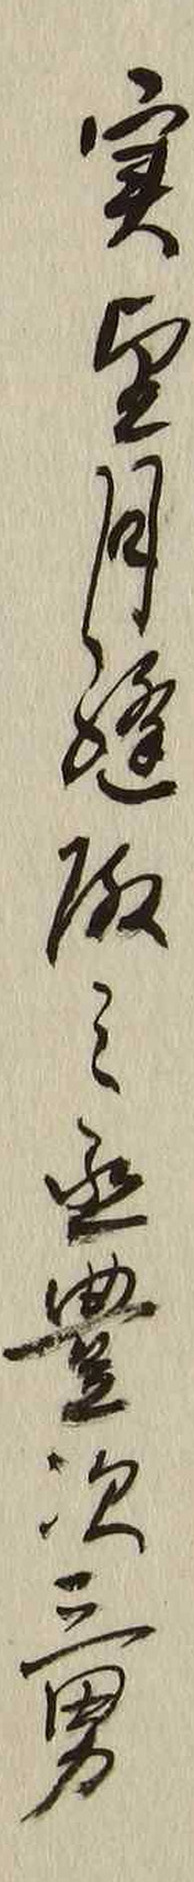実望月縫殿之丞豊次三男
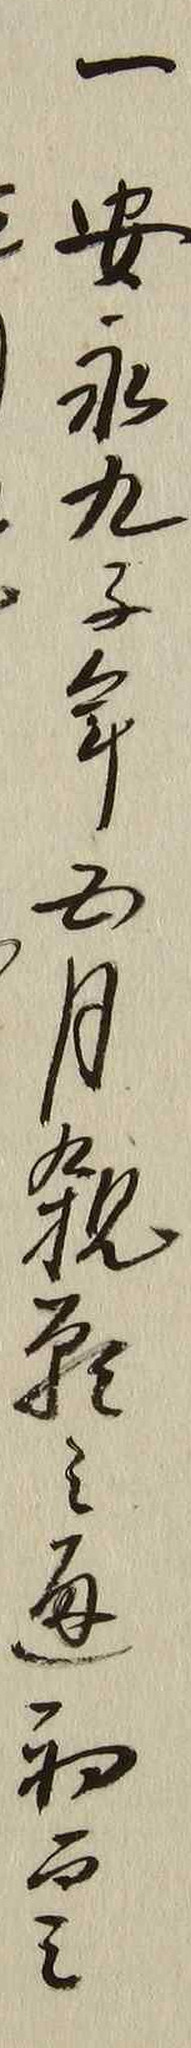一安永九子年五月親願之通初而之
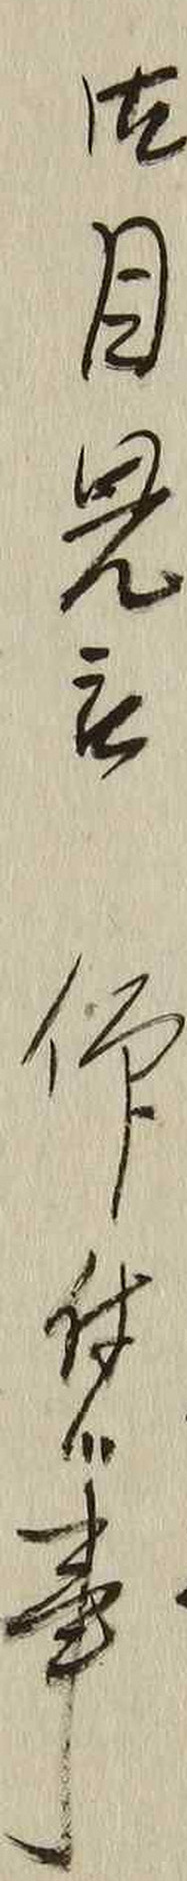御目見被仰付候事
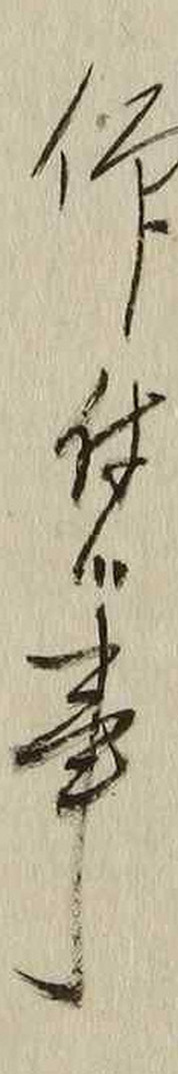仰付候事
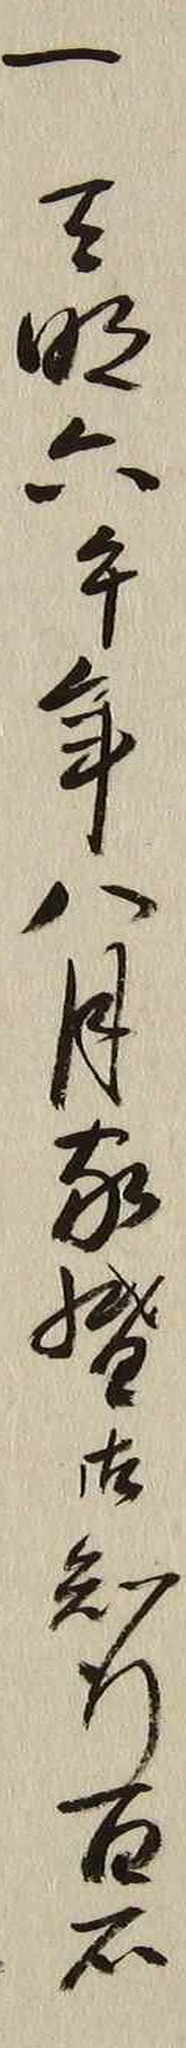一天明六午年八月家督御知行百石
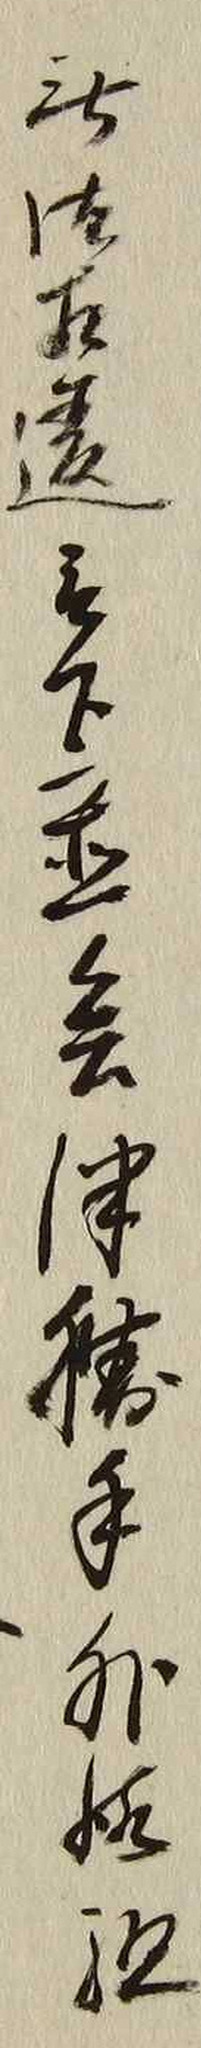無御相違被下置会津勝手外様組
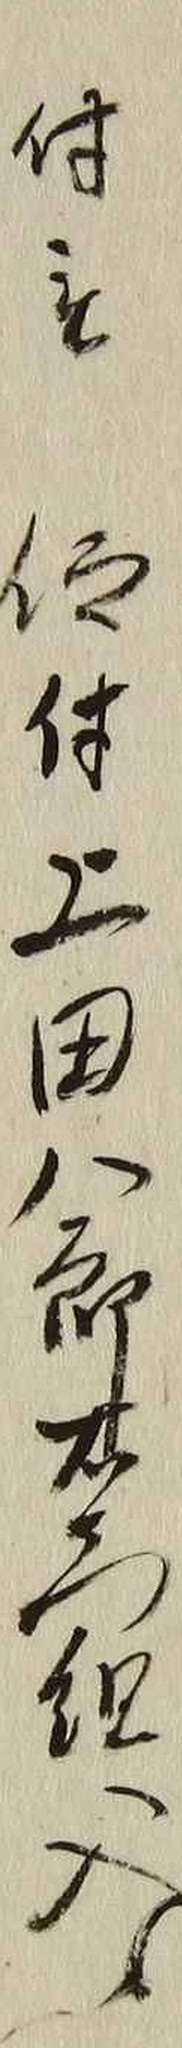付被仰付上田八郎右衛門組へ入候
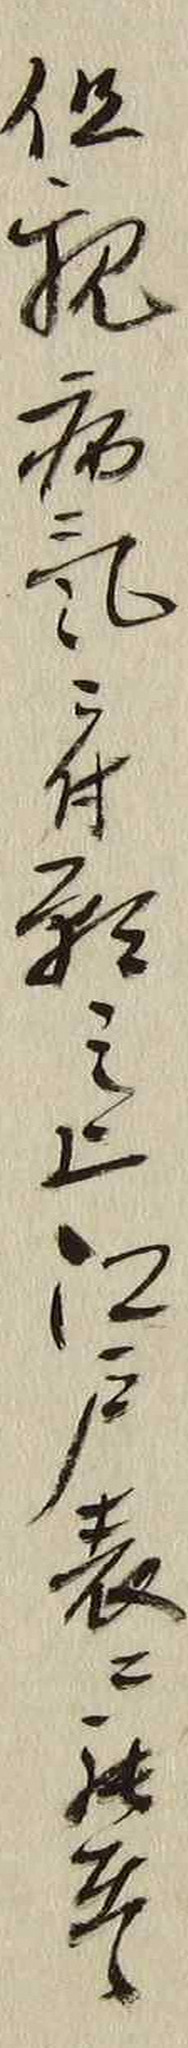但親病気ニ付願之上江戸表ニ罷在候
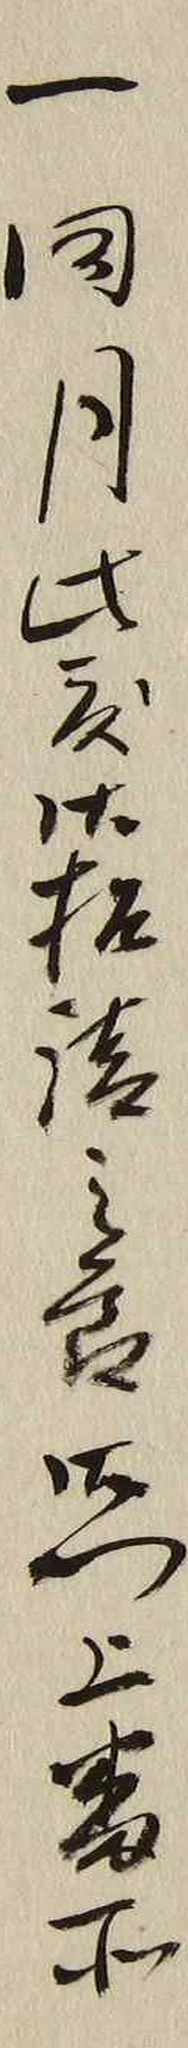一同月此度御招請之節御門上番所
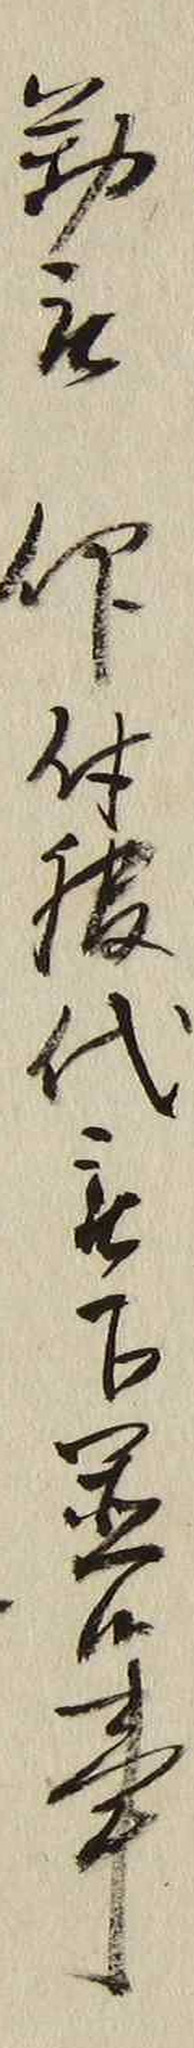勤被仰付服代被下置候事
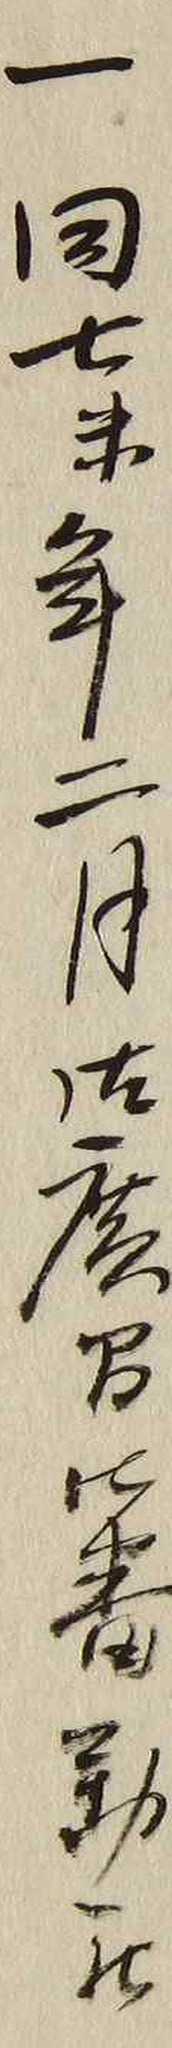一同七未年二月御広間御番勤被
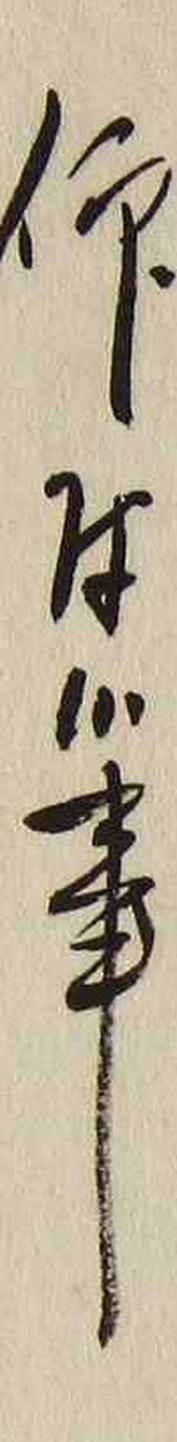仰付候事
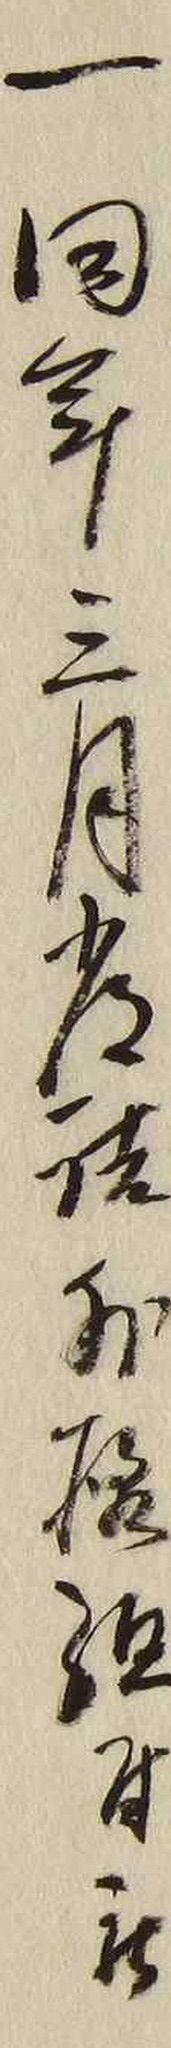一同年三月常詰外様組付被
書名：諸士系譜　巻之349　も之部5
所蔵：会津若松市立会津図書館
